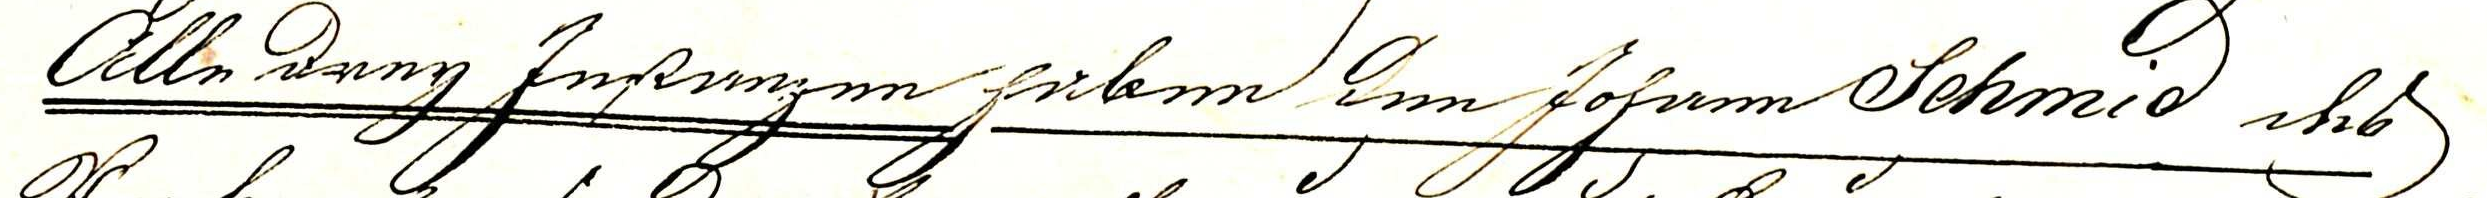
Alle drey Instanzen haben den Johann Schmid des
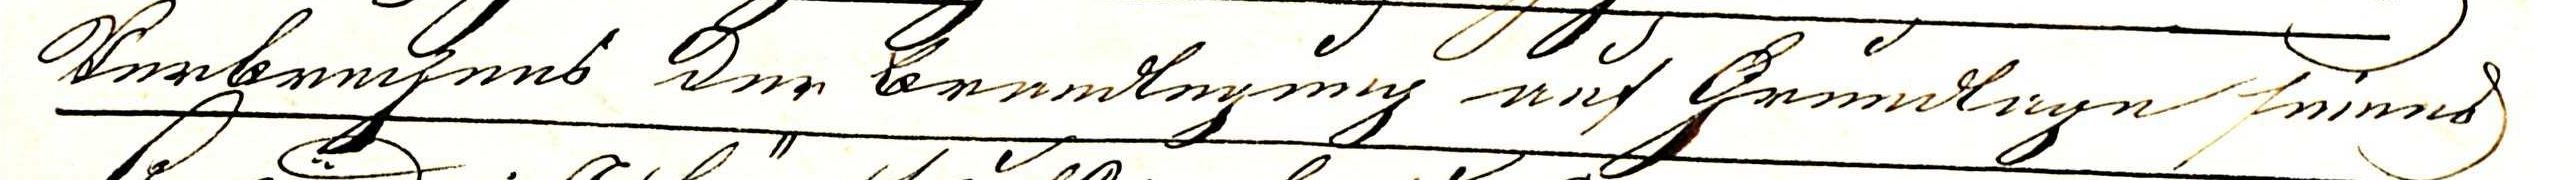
Verbrechens der Brandlegung auf Grundlage seines
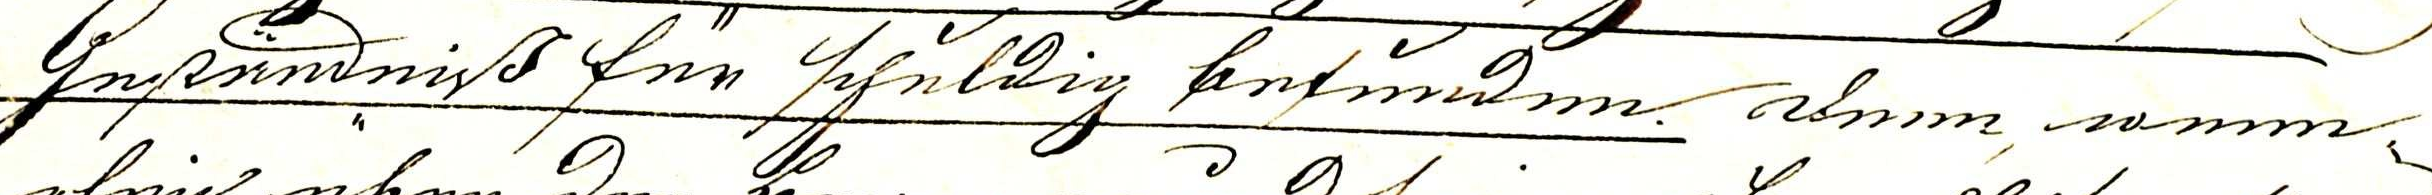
Geständniß für schuldig befunden. Denn, wenn
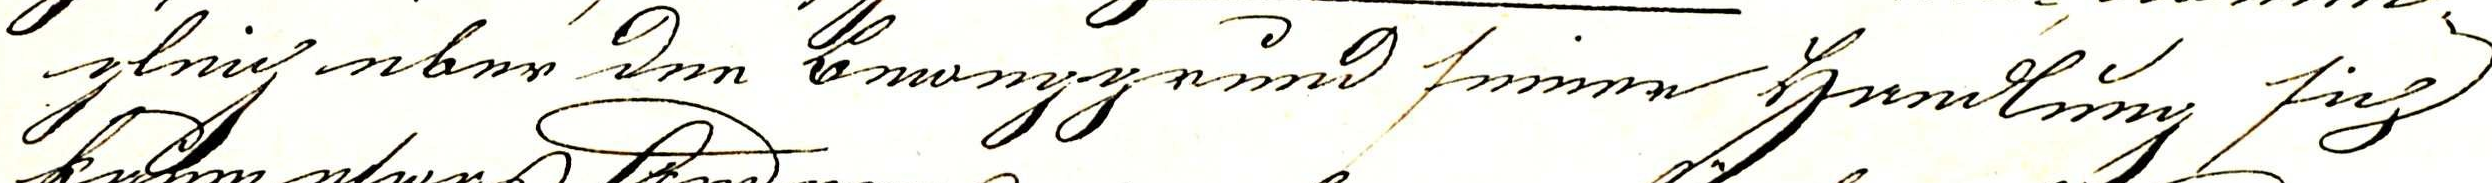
gleich über den Beweggrund seiner Handlung sich
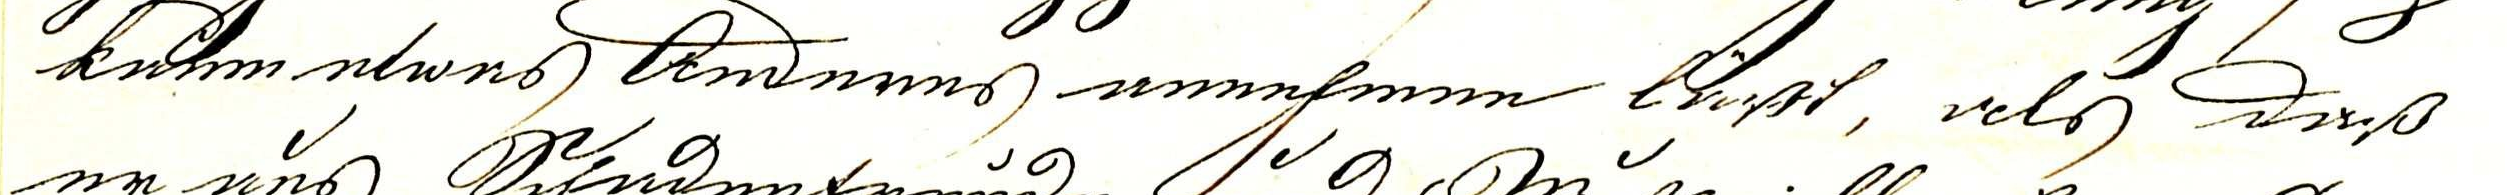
kaum etwas Anderes annehmen läßt, als daß
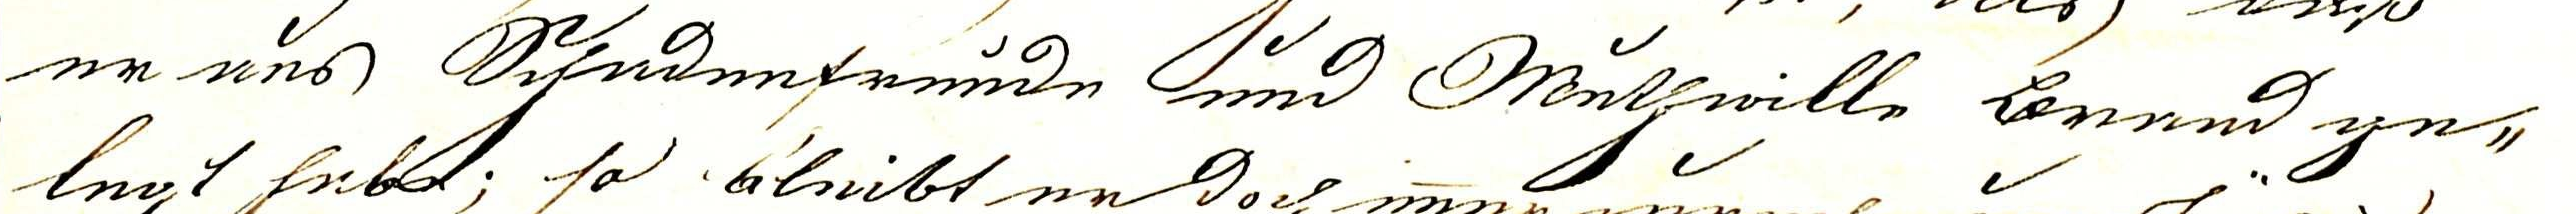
er aus Schadenfreude und Muthwille Brand ge¬
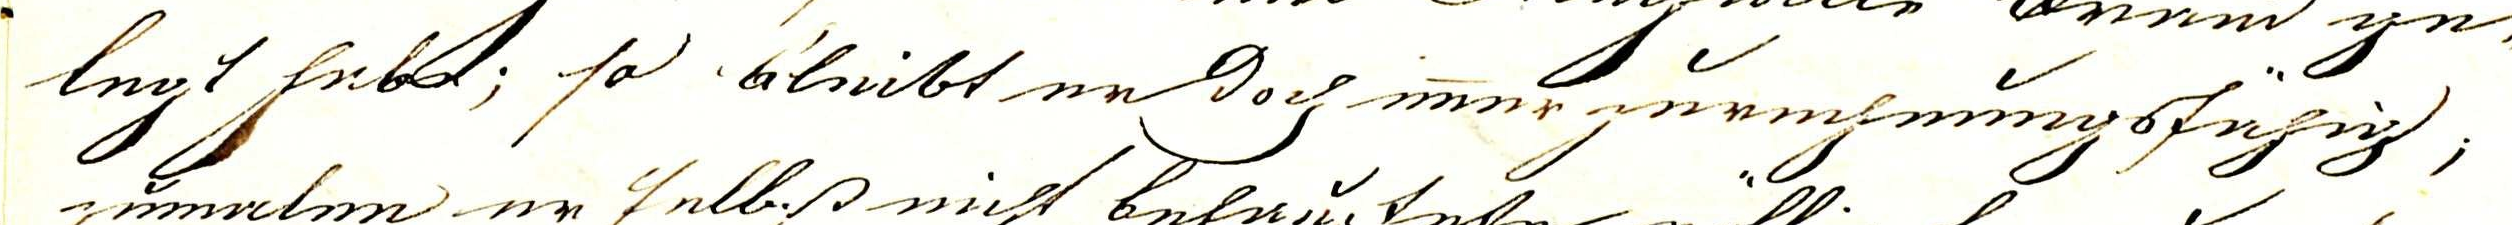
legt habe; so bleibt er doch immer zurechnungsfähig;
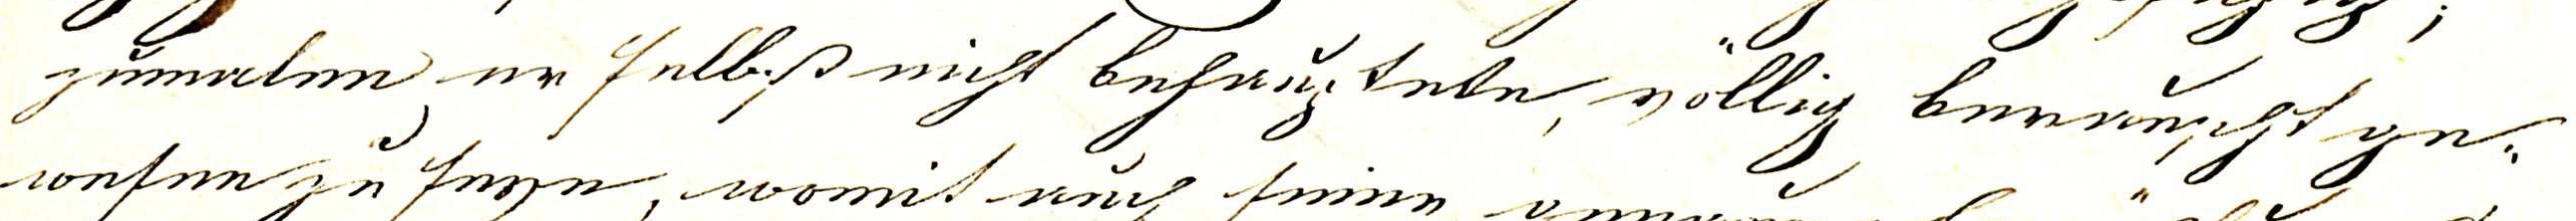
zumalen, er selbst nicht behauptete, völlig berauscht ge¬
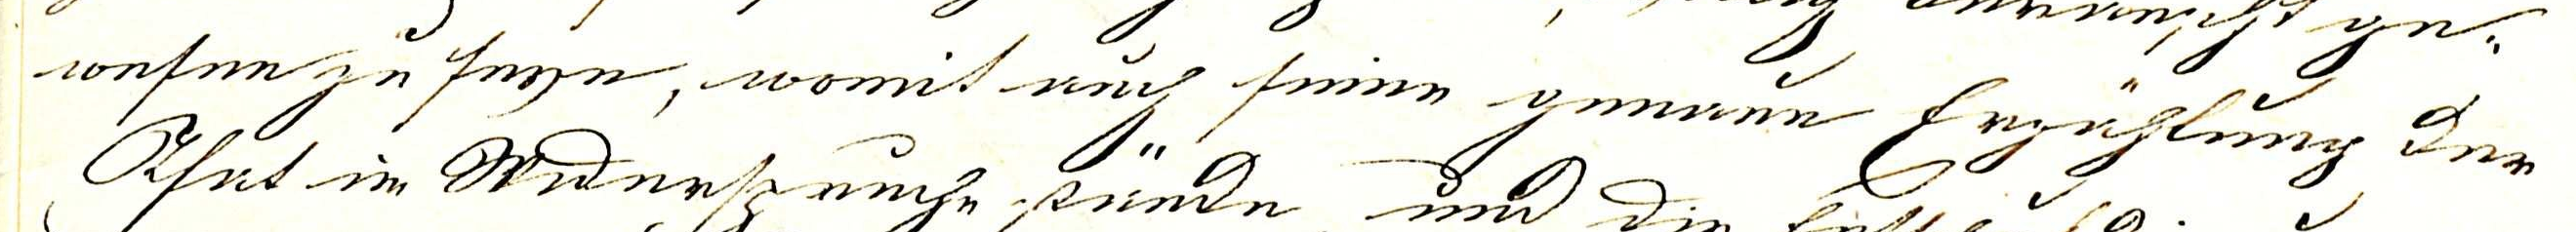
wesen zu seyn, womit auch seine genaue Erzählung der
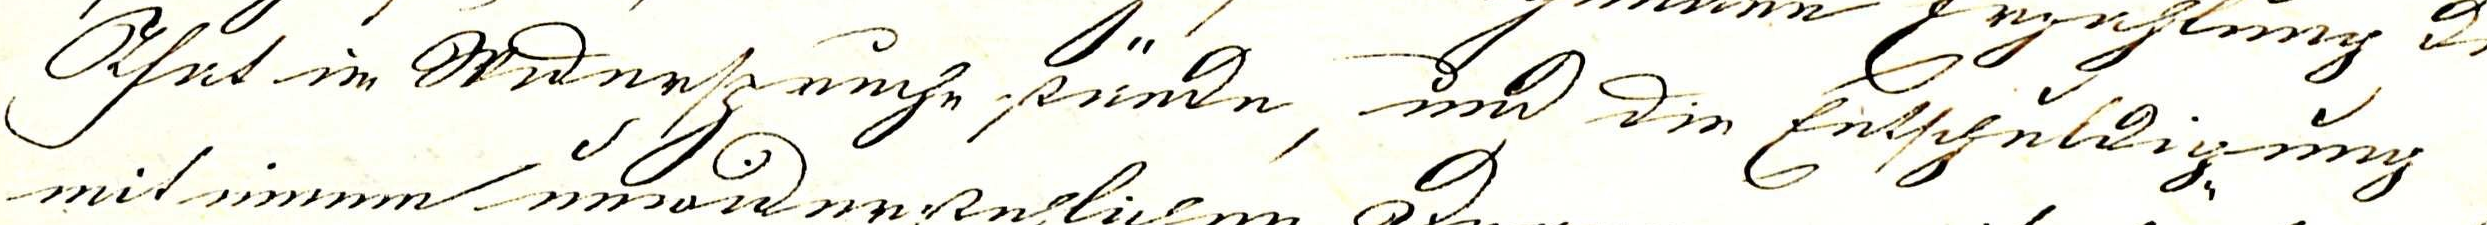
That im Widerspruche stünde, und die Entschuldigung
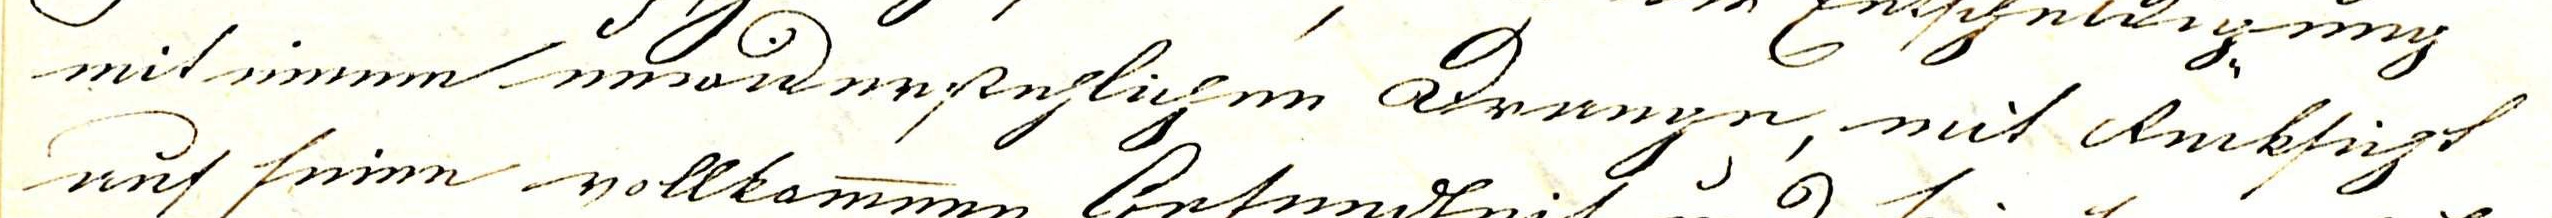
mit einem unwiderstehlichen Drange, mit Rücksicht
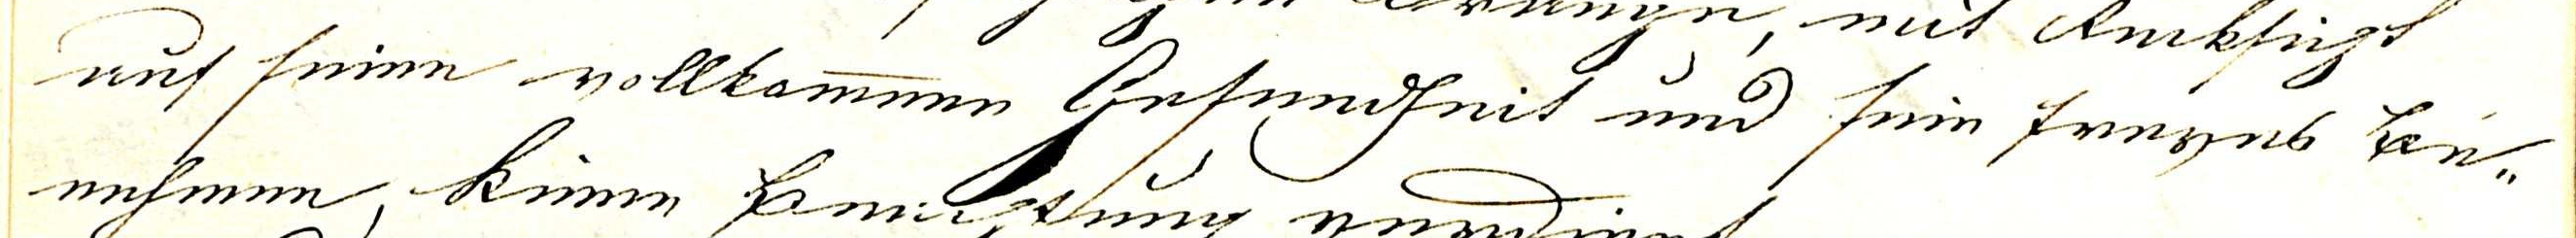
auf seine vollkommene Gesundheit und sein freyes Be¬
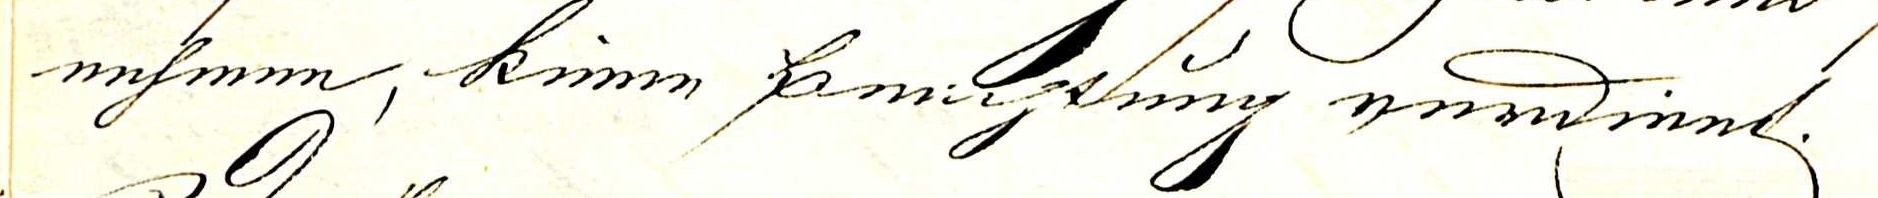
nehmen, keine Berichtung verdient.
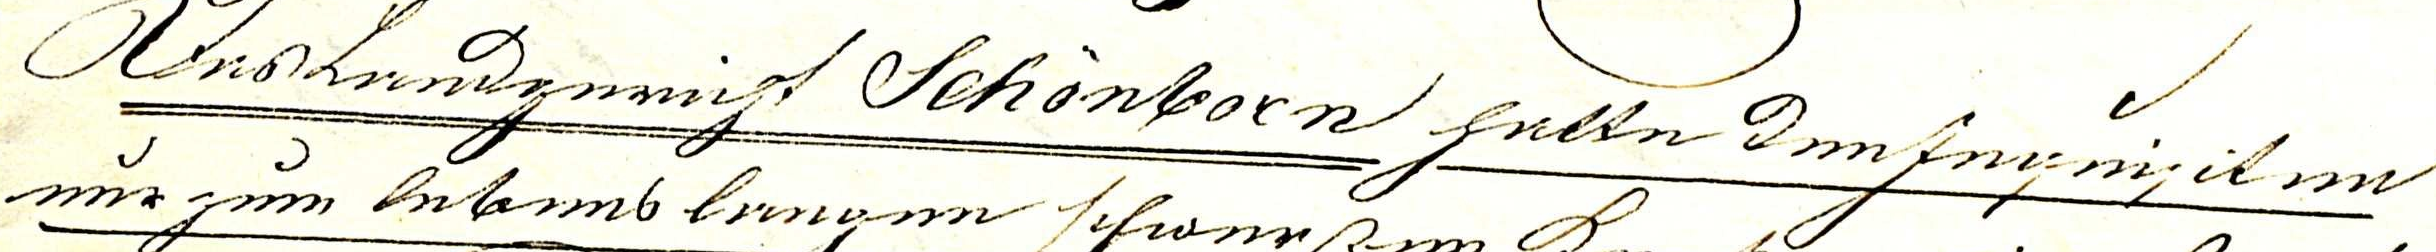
Das Landgericht Schönborn hatte dem Inquisiten
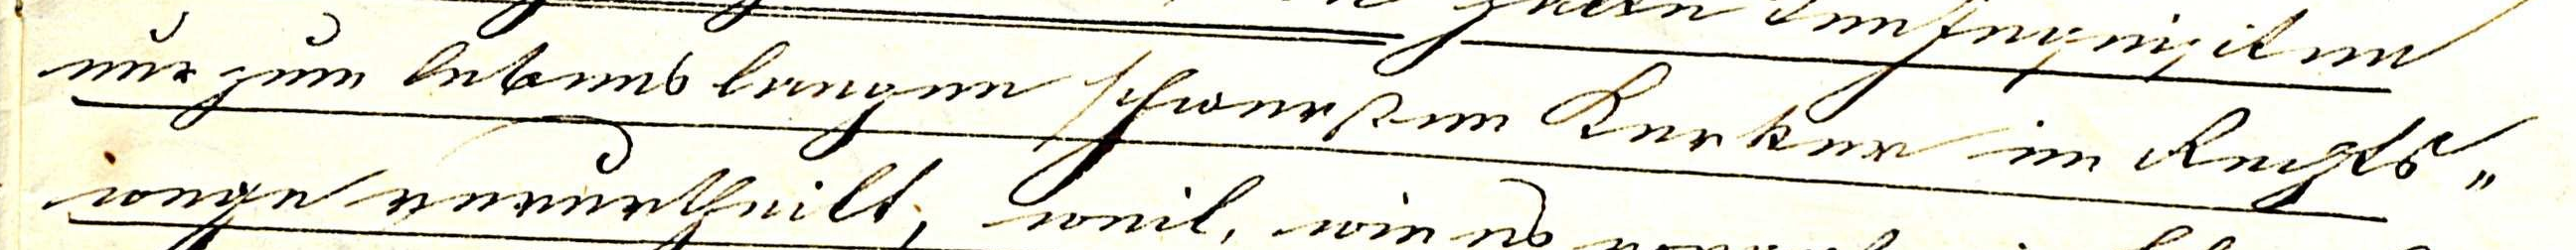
nur zum lebenslangen schwersten Kerker im Rechts¬
